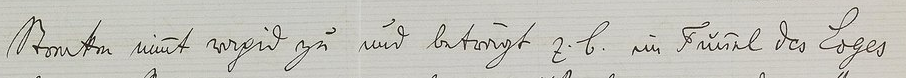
Strecken nimmt rapid zu und beträgt z. B. im Tunnel des Loges
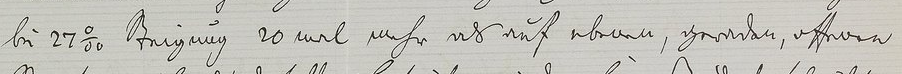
bei 27‰ Steigung 20 mal mehr als auf ebenen, geraden, offenen
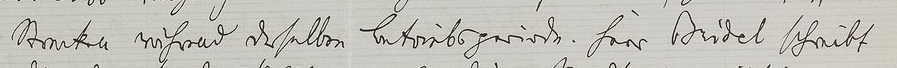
Strecken während derselben Betriebsperiode. Herr Bridel schreibt
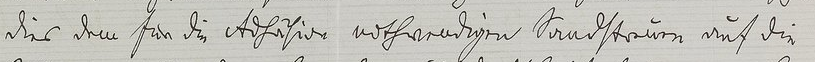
dies dem für die Adhäsion nothwendigen Sandstreuen auf die
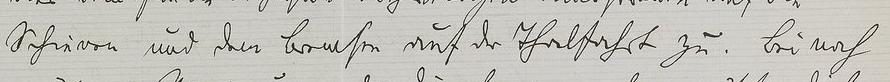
Schienen und dem Bremsen auf der Thalfahrt zu. Bei noch
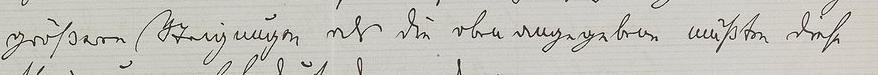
größeren Steigungen als die oben angegebnen müßten diese
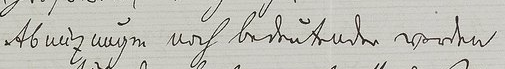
Abnüzungen noch bedeutender werden.
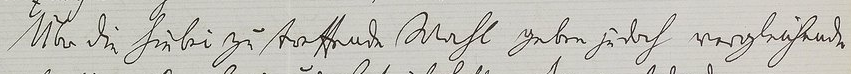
Über die hiebei zu treffende Wahl geben jedoch vergleichende
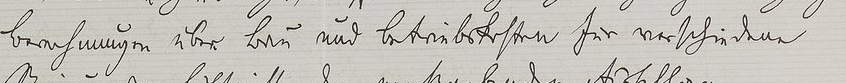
Berechnungen über Bau und Betriebskosten für verschiedene
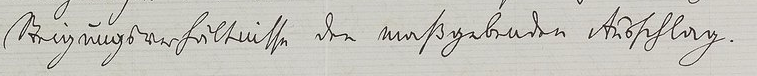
Steigungsverhältnisse den maßgebenden Ausschlag.
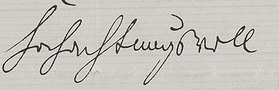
Hochachtungsvoll
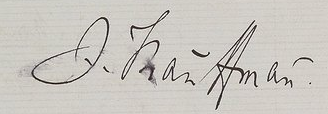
J. Kauffmann.
